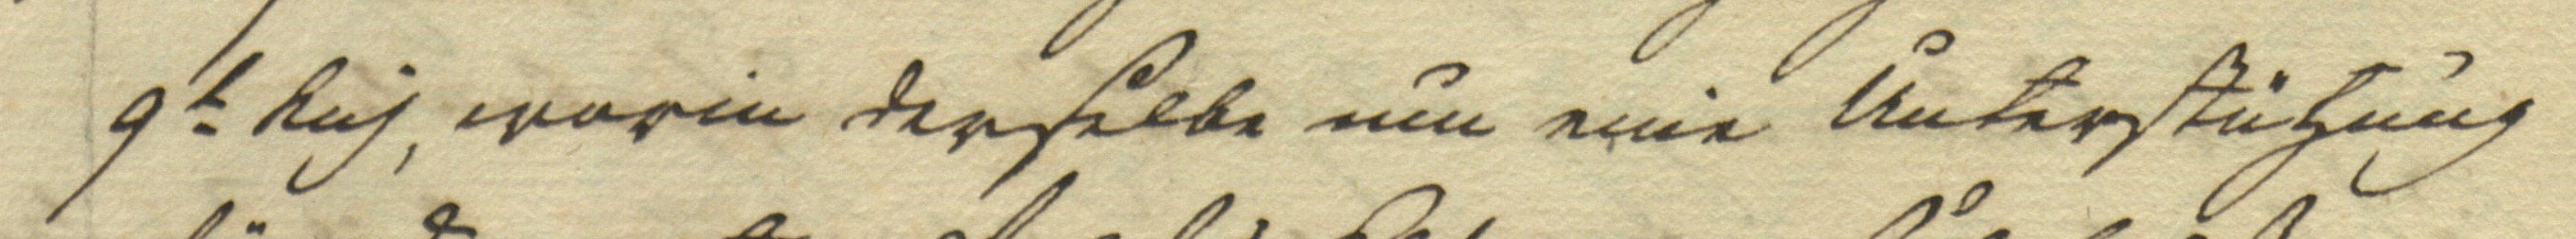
9 t huj, worin derselbe um eine Unterstützung
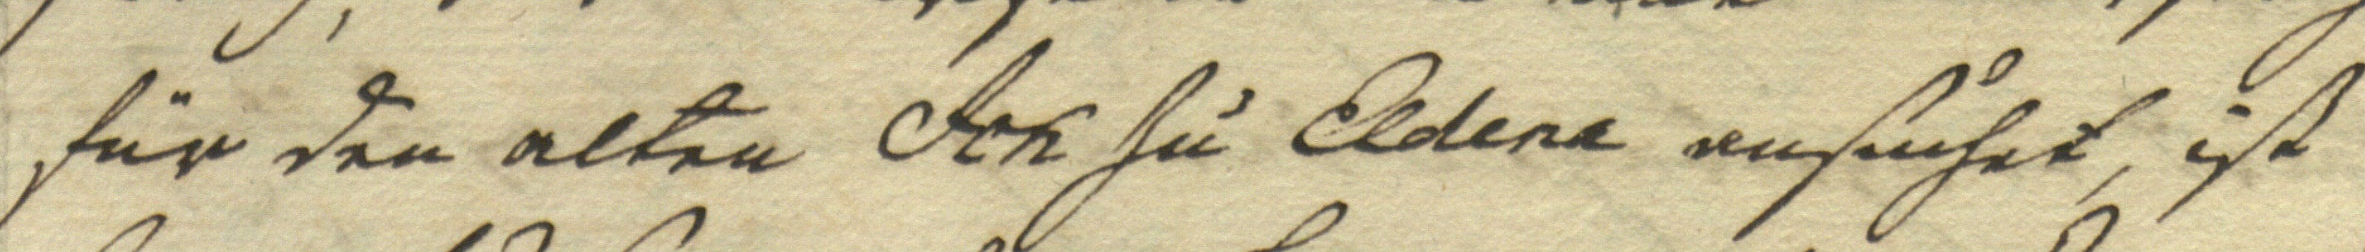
für den alten Ick zu Eldena ansuchet, ist
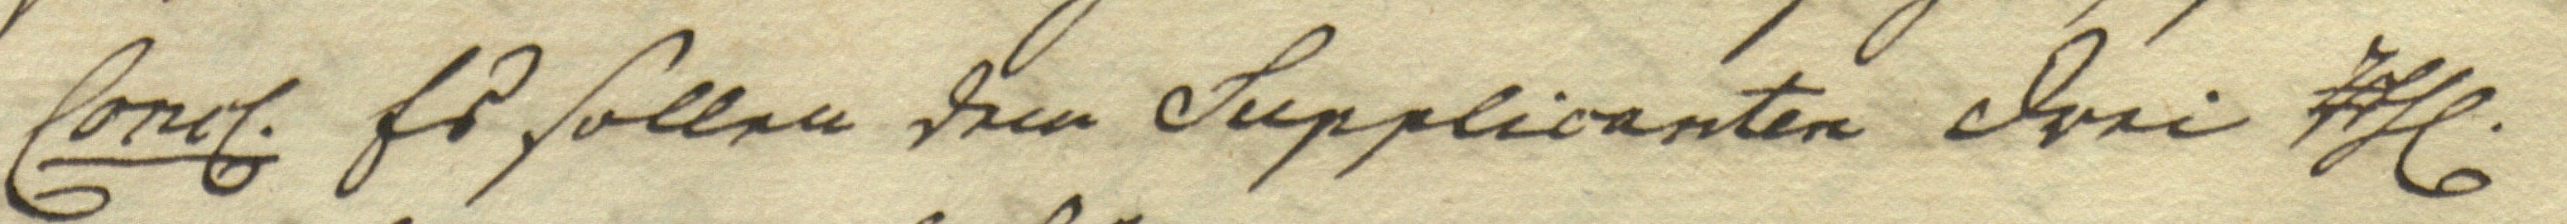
Concl. Es sollen dem Supplicanten Drei Rthl.
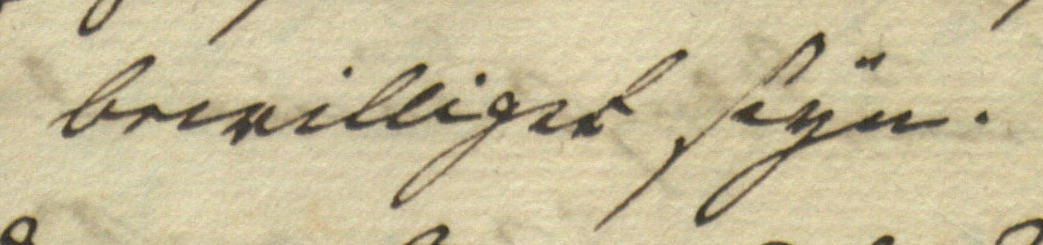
bewilliget seÿn.
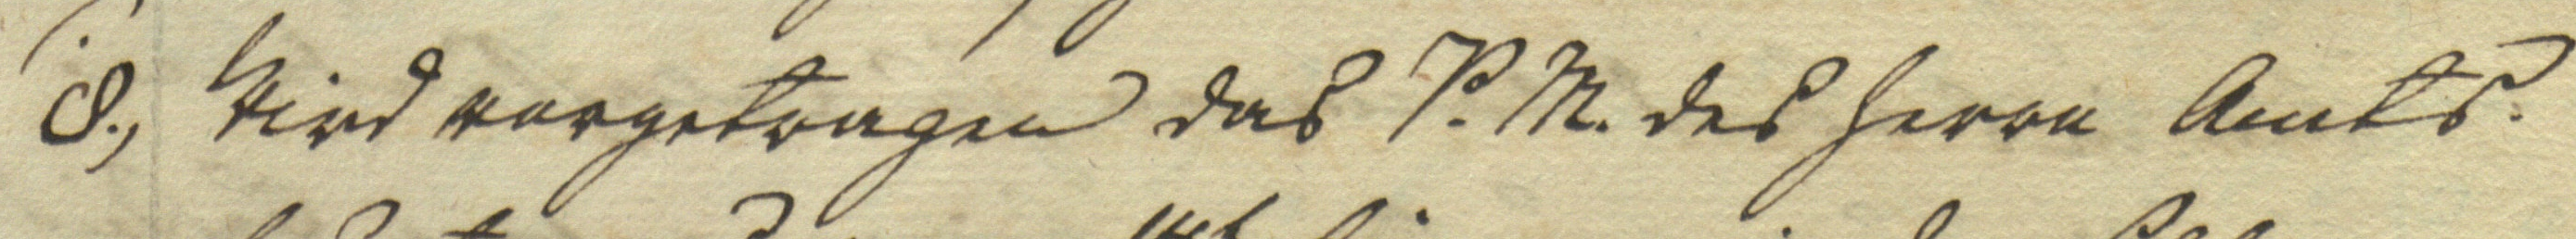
8., Wird vorgetragen das P. M. des Herrn Amts¬
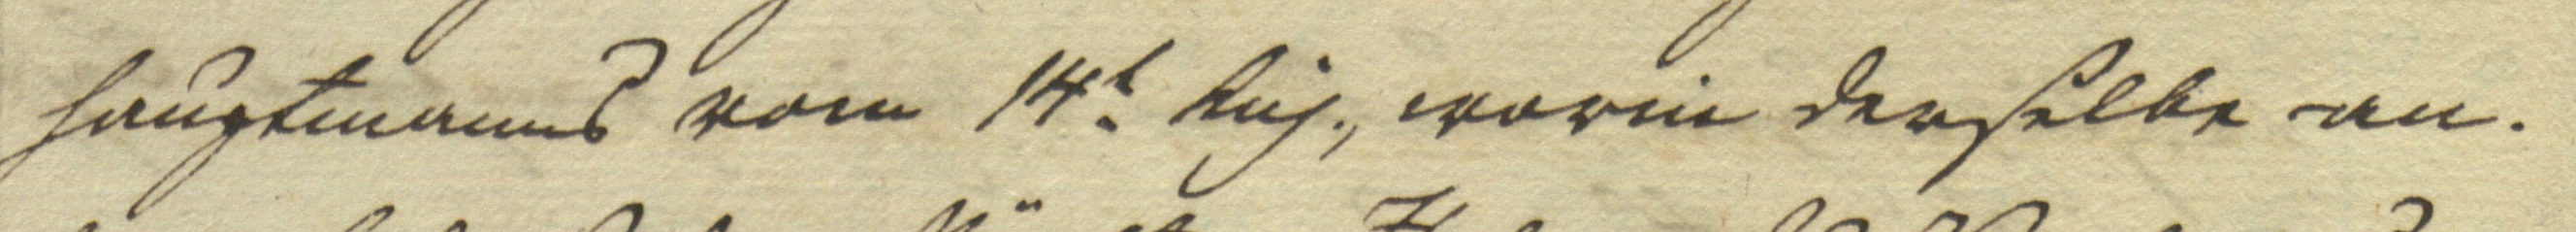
hauptmanns vom 14. huj., worin derselbe an¬
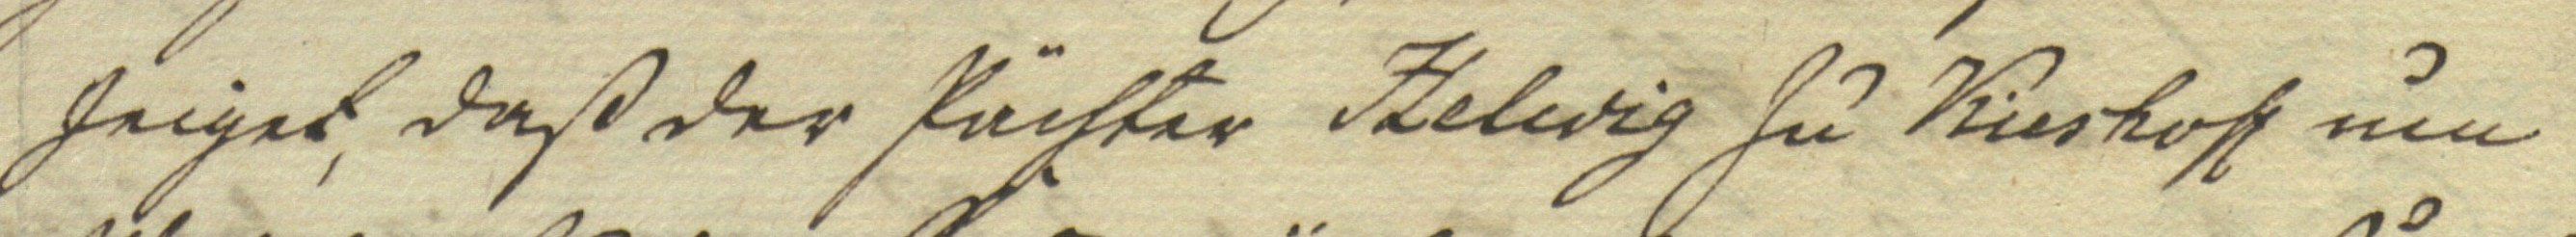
zeiget daß der Pächter Helwig zu Kieshoff um
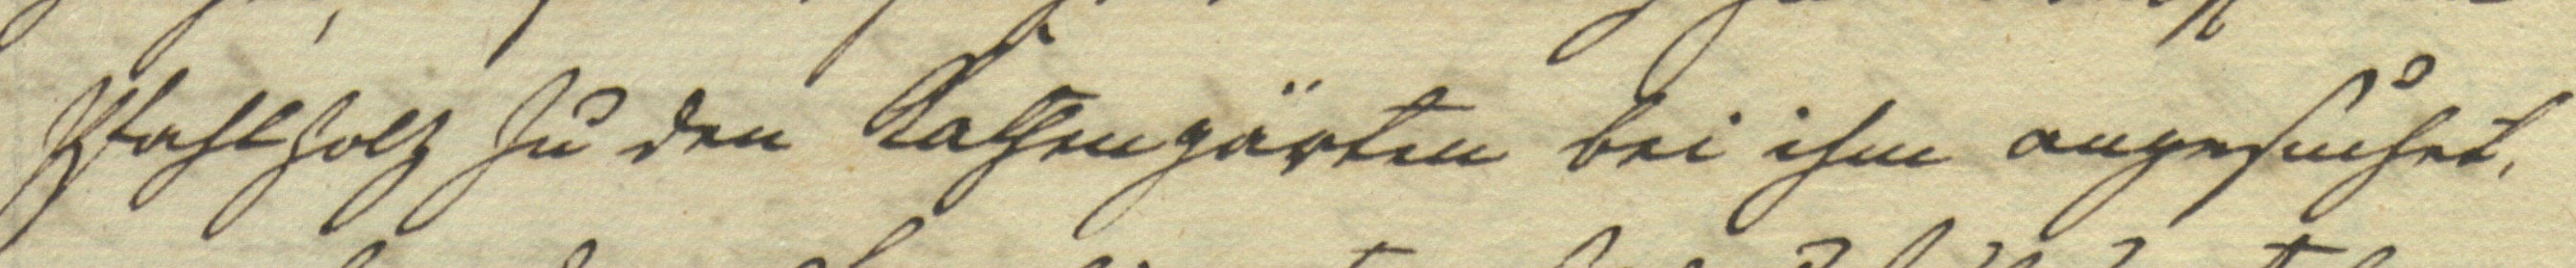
Pfahlholz zu den Kathengärten bei ihm angesuchet,
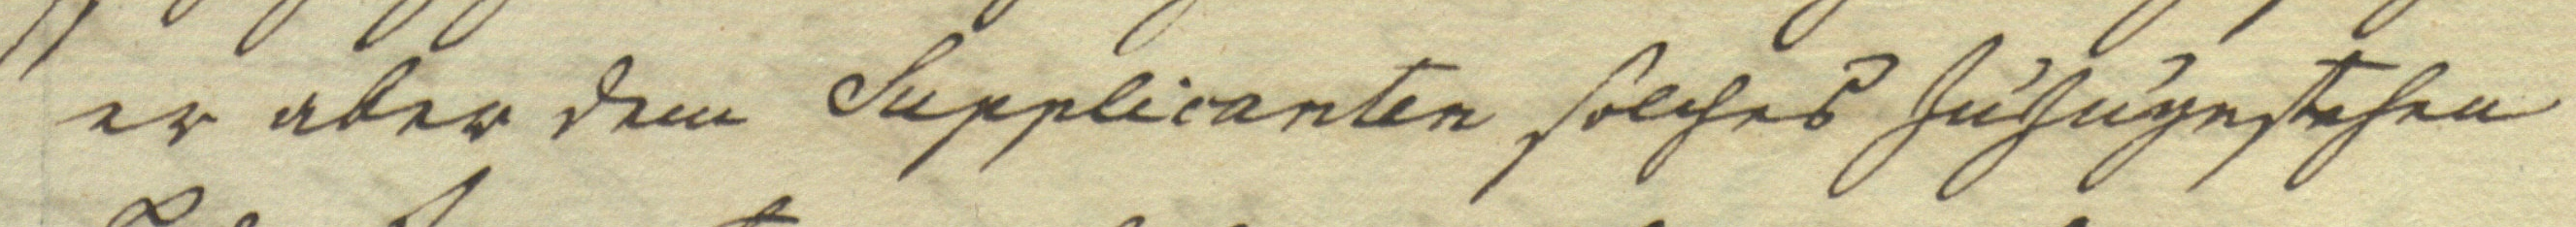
er aber dem Supplicanten solches zuzugestehen
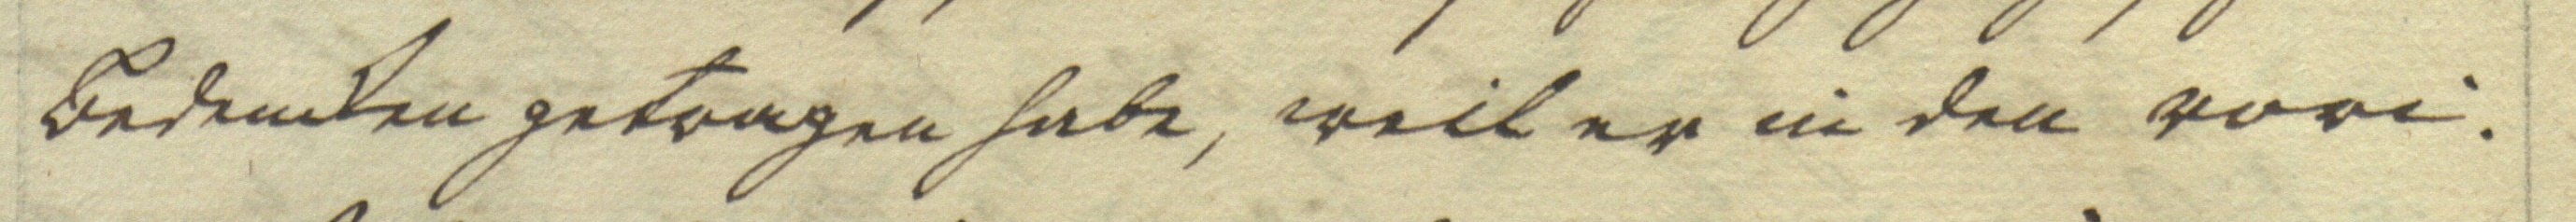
Bedencken getragen habe, weil er in den vori¬
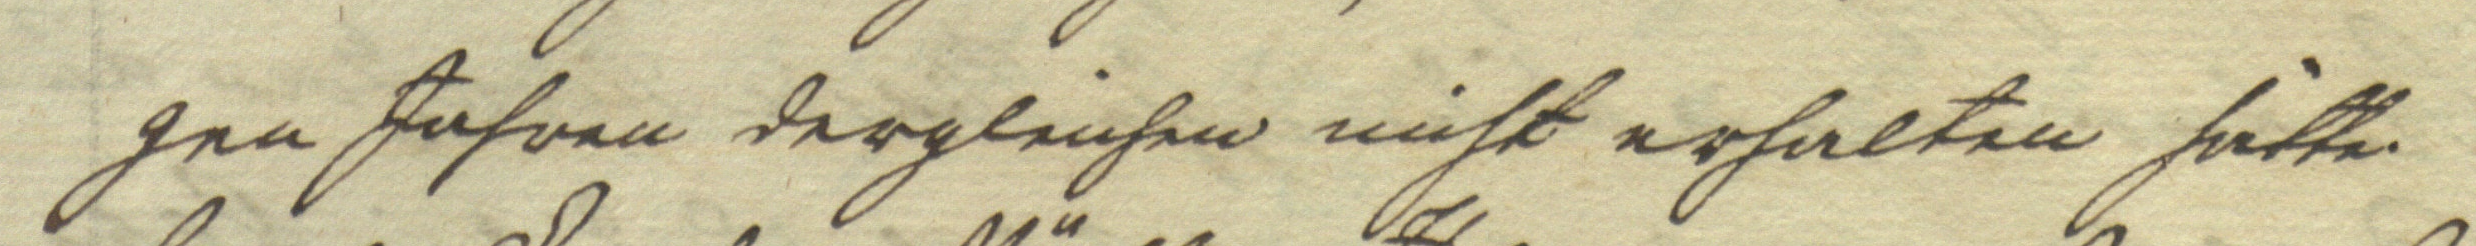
gen Jahren dergleichen nicht erhalten hätte.
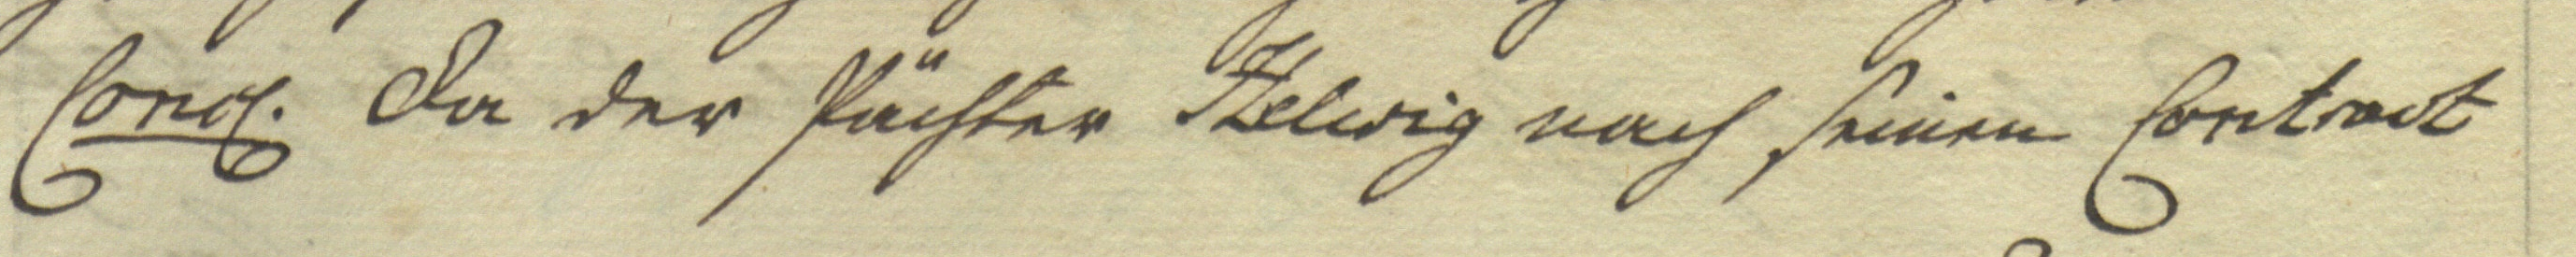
Concl. Da der Pächter Helwig nach seinem Contract
